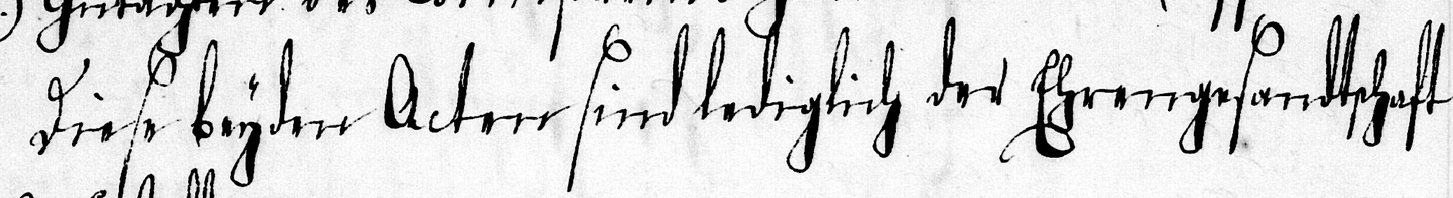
Diese beyden Acten sind lediglich der Ehrengesandtscha¬
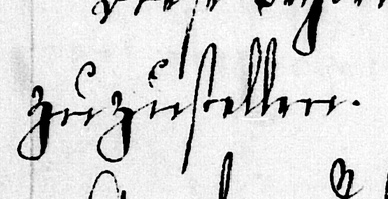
zuzustellen.
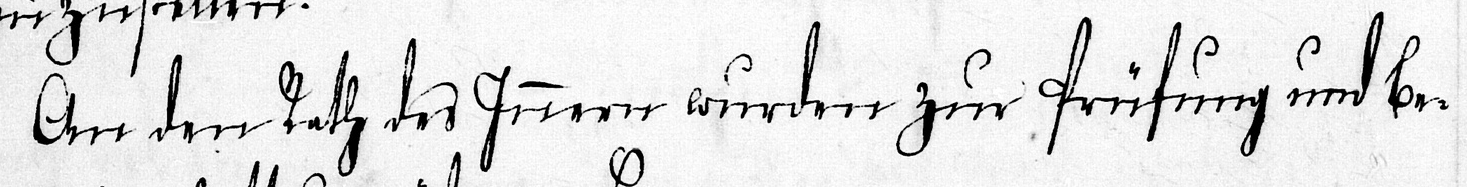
An den Rath des Innern wurden zur Prüfung und Be¬
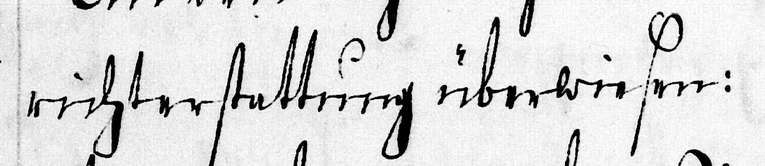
richterstattung überwiesen:
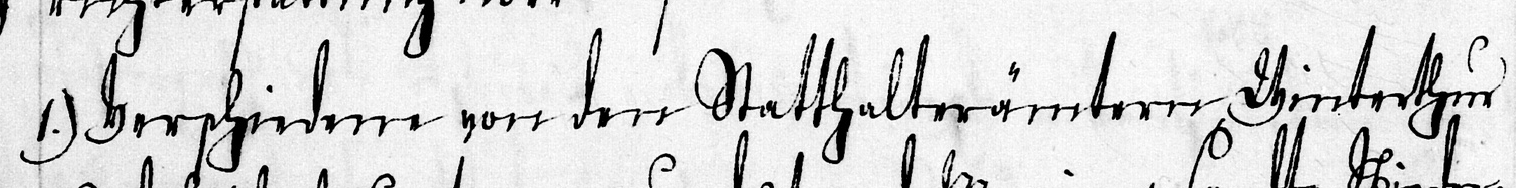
1.) Verschiedene von den Statthalterämtern Winterthur
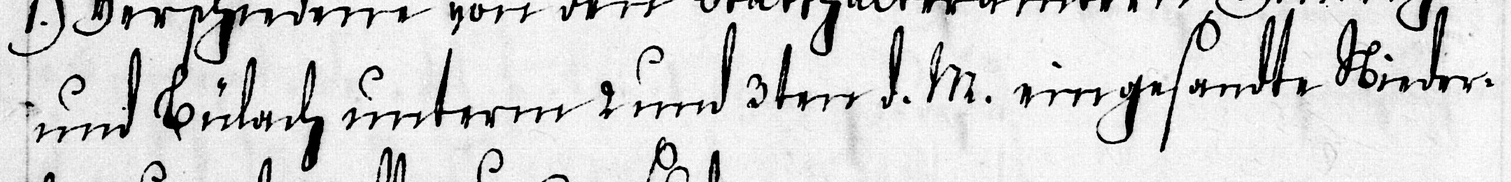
und Bülach unterm 2 und 3ten d. M. eingesandte Nieder¬
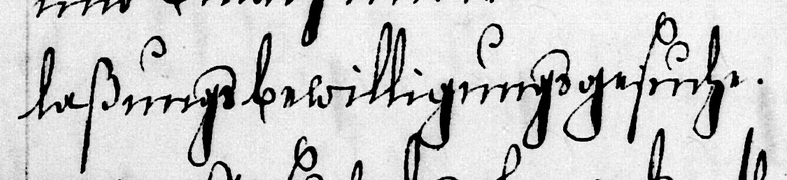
laßungsbewilligungsgesuche.
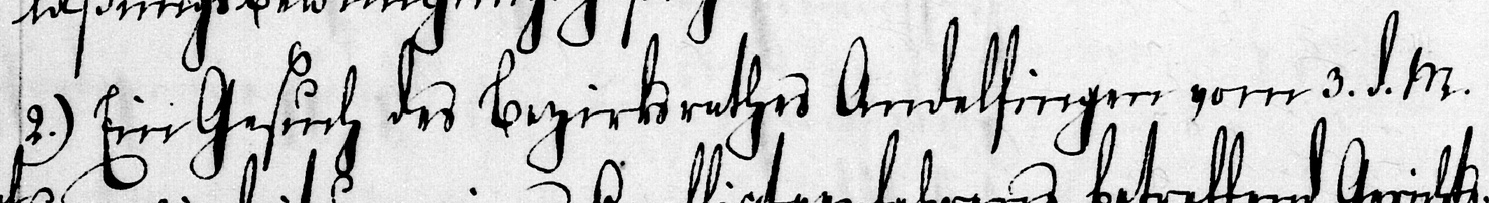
2.) Ein Gesuch des Bezirksrathes Andelfingen vom 3. d. M.
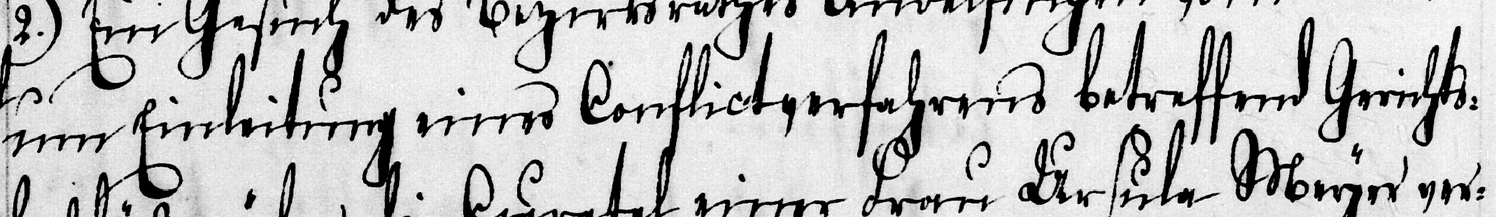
um Einleitung eines Conflictverfahrens betreffend Gericht¬
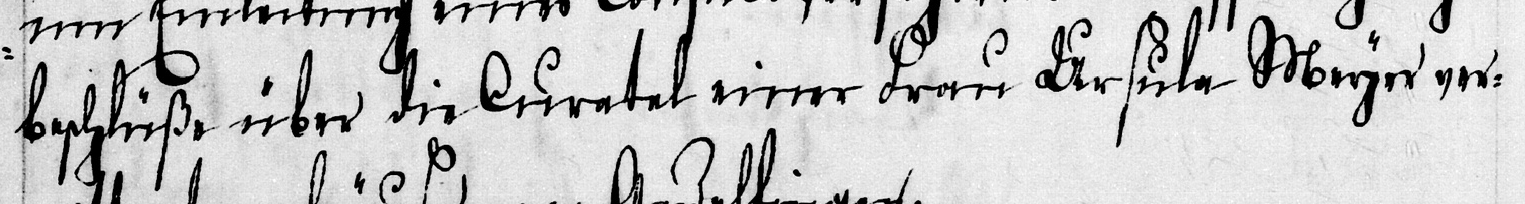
beschlüße über die Curatel einer Frau Ursula Meyer ver¬
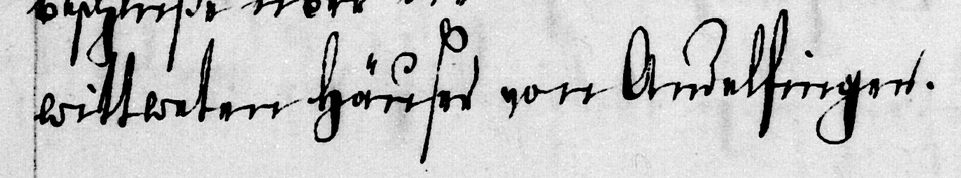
wittweten Häuser von Andelfingen.
